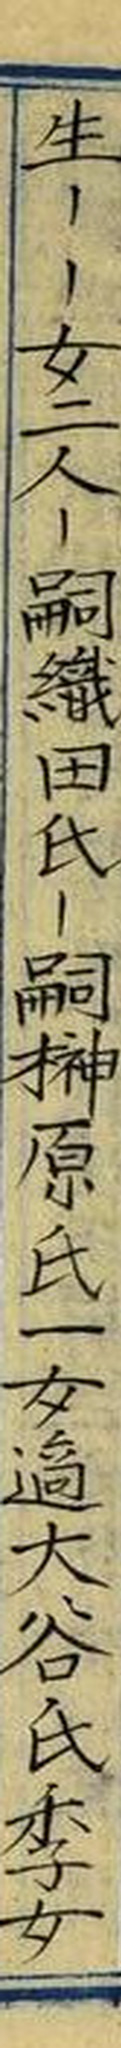生――女二人―嗣織田氏―嗣榊原氏一女適大谷氏季女
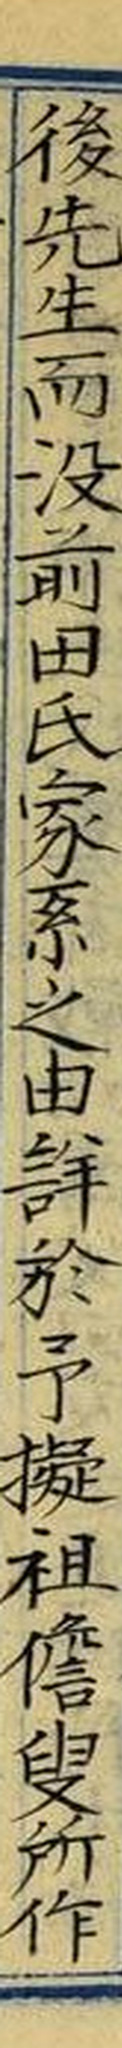後先生而没前田氏家系之由詳於予擬祖儋叟所作
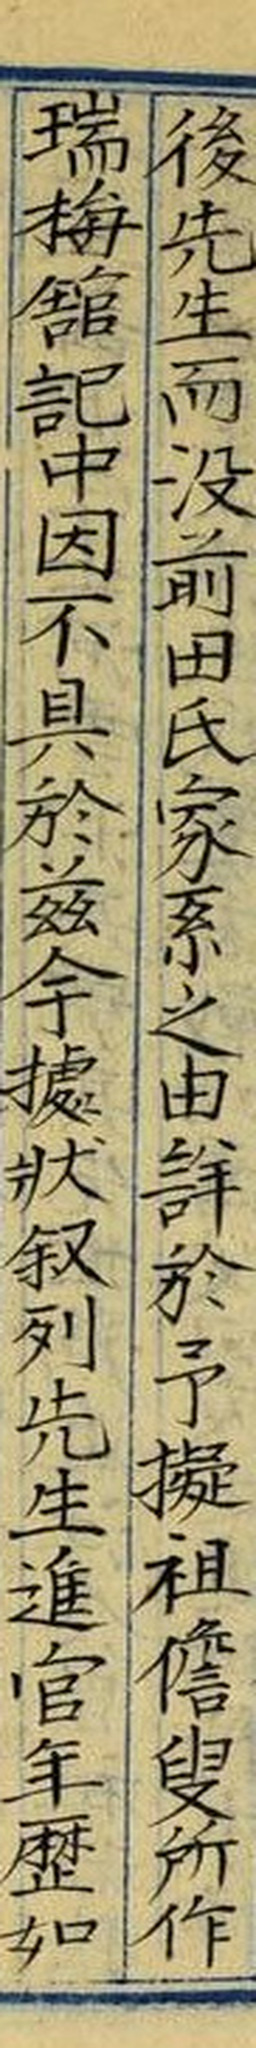瑞梅舘記中因不具於玆今據狀叙列先生進官年歴如
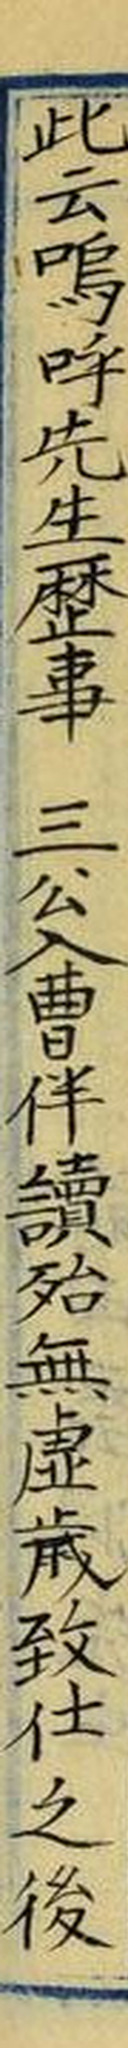此云鳴呼先生歴事三公入曹伴讀殆虛歳致仕之後
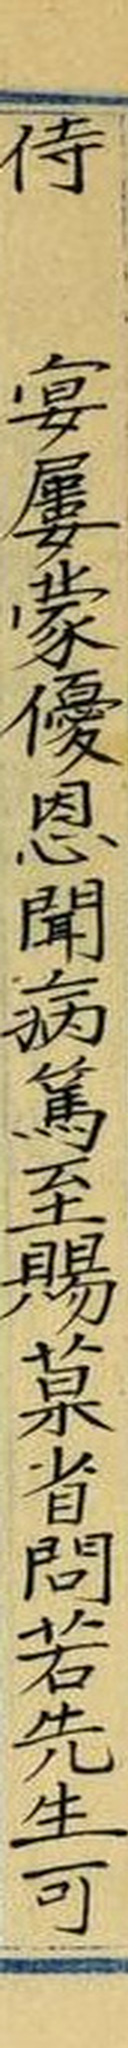侍宴屢蒙優恩聞病篤至賜菒省問若先生可
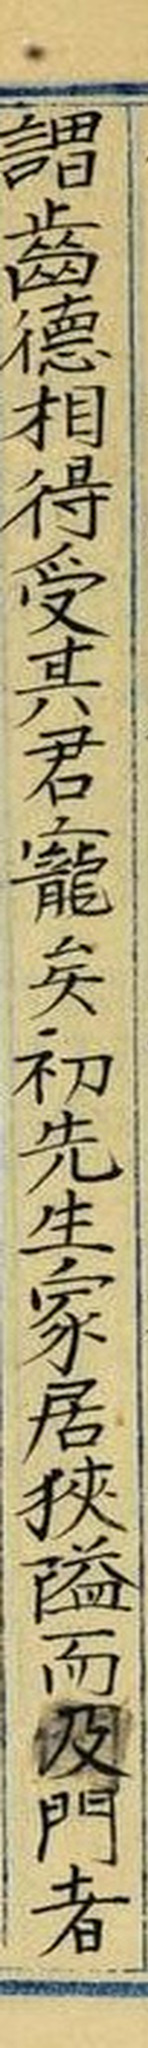謂齒德相得受其君寵矣初先生家居狹隘而及門者
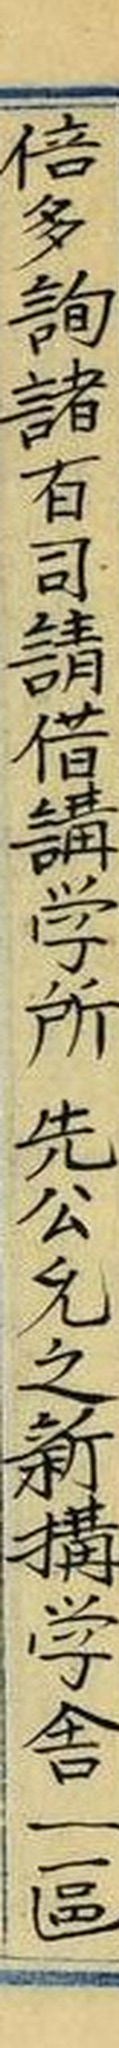倍多詢諸有司請借講学所先公允之新構学舎一區
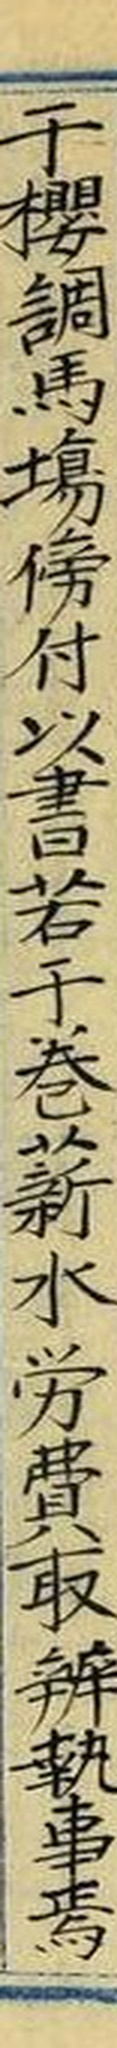于櫻調馬塲傍付以書若干巻薪水労費取辨執事焉
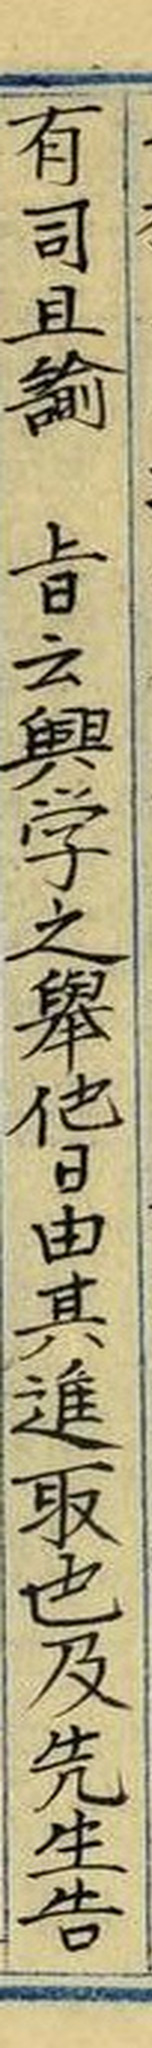有司且諭㫖云興学之舉他日由其進取也及先生告
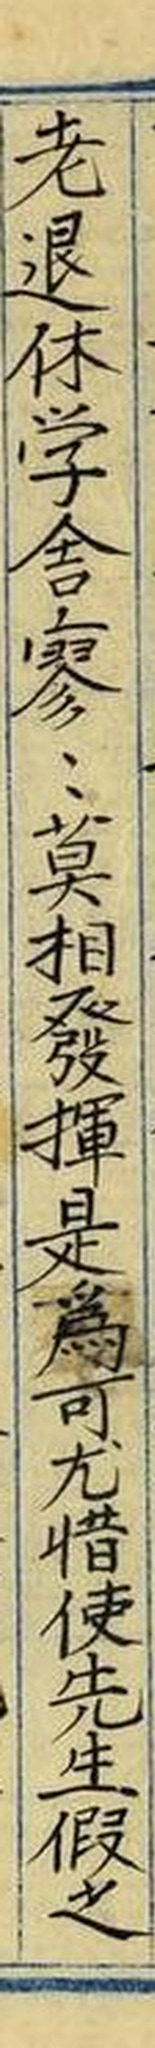老退休学斜舎寥々莫相發揮是爲可尤惜使先生假之
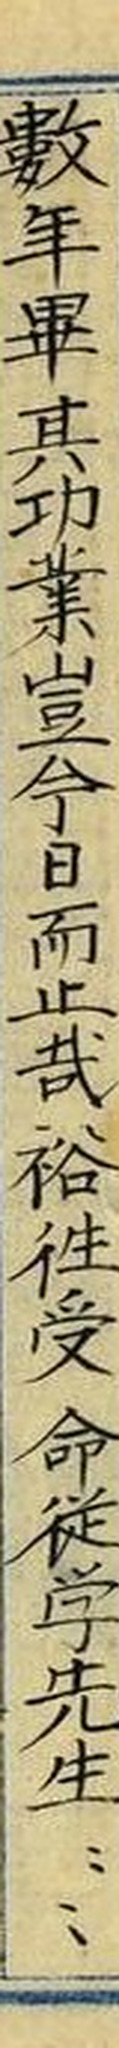數年畢其功業豈今日而止哉裕往受命従学先生々々
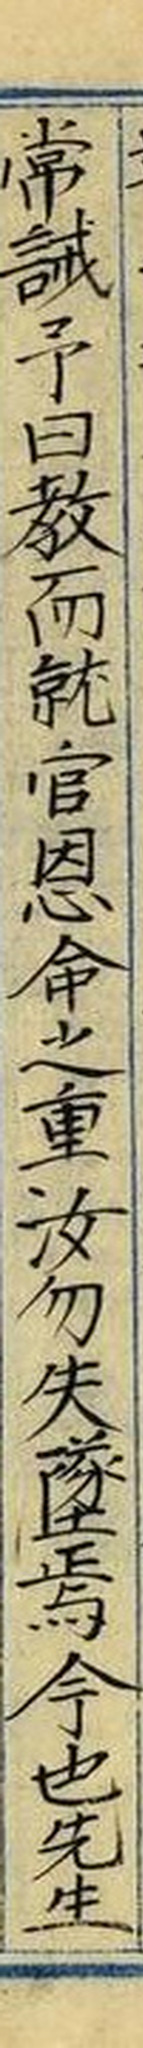常誡予曰教而就官恩𠇭之重汝勿失墜焉今也先生
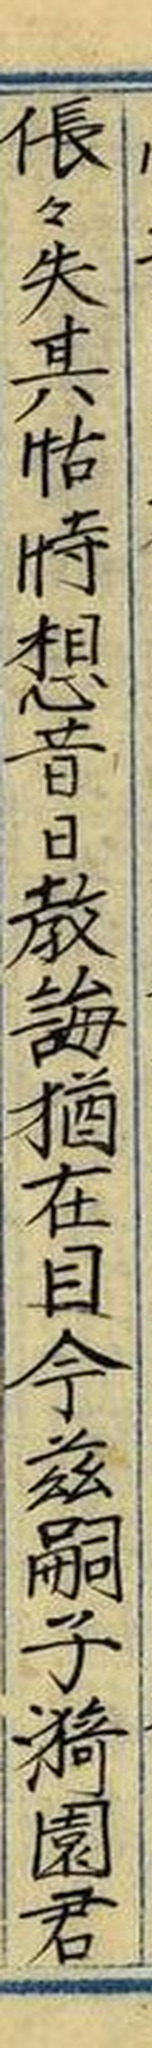倀々失其怙恃想昔日教誨猶在目今茲嗣子漪園君
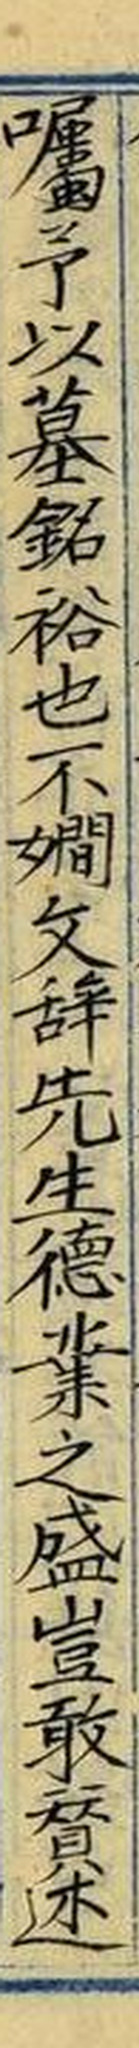囑予以墓銘裕也不嫺文辞先生德業之盛豈敢賛述

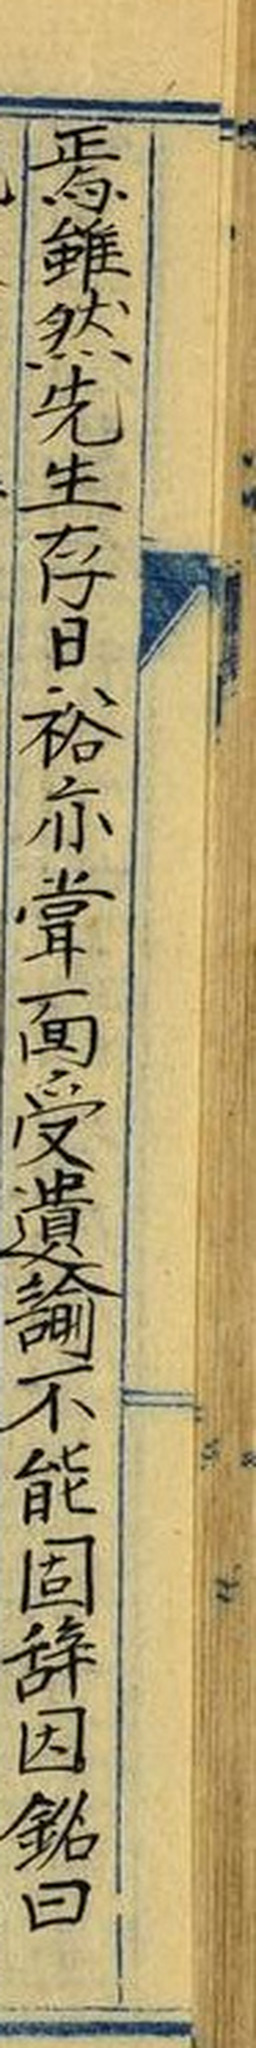焉雖然先生存日裕亦嘗面受遺諭不能固辞因銘曰
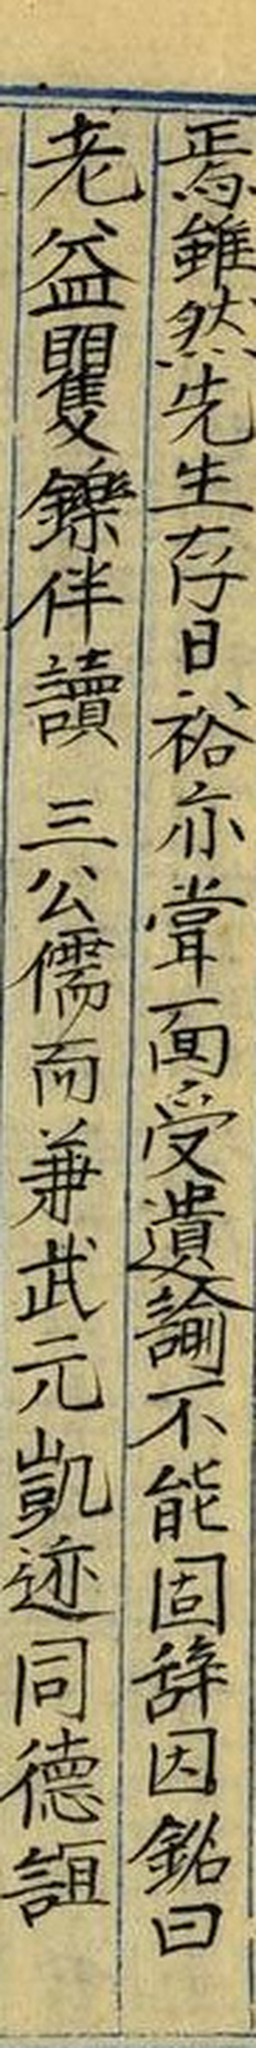老益矍鑠伴讀三公儒而兼武元凱迹德誼
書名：温古集 四巻
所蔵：福井県文書館 Fukui Prefectural Archives
